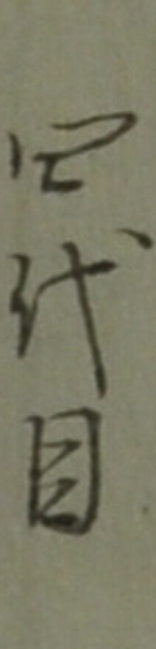四代目
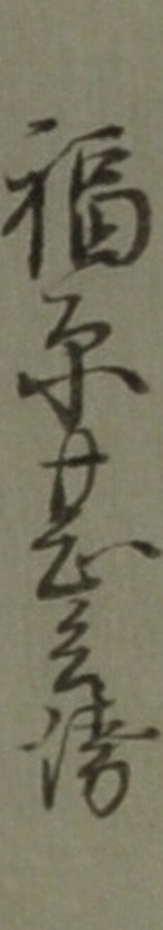福原甚兵衛
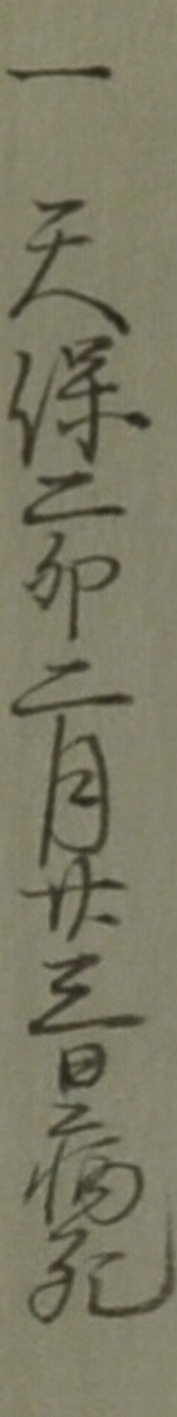一天保二卯二月廿三日病死
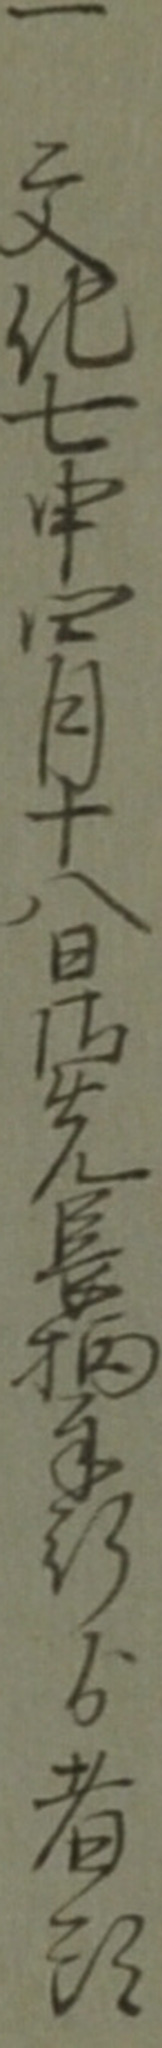一文化七申四月十八日御先長柄奉行ゟ者頭
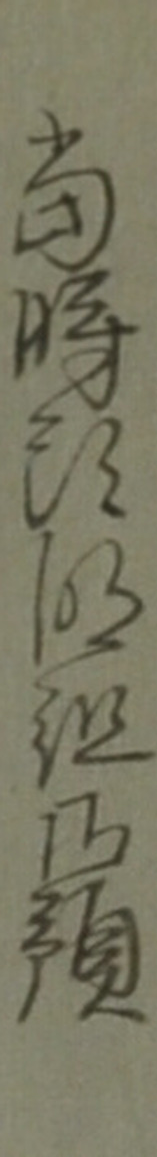当時頭明組御預
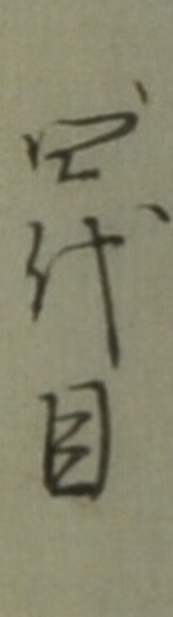四代目

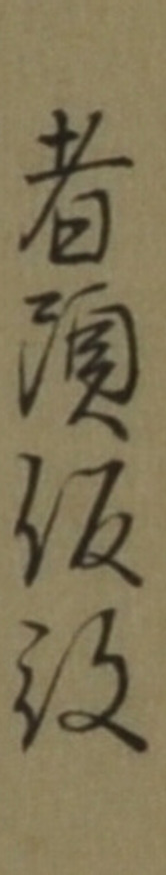者頭仮役
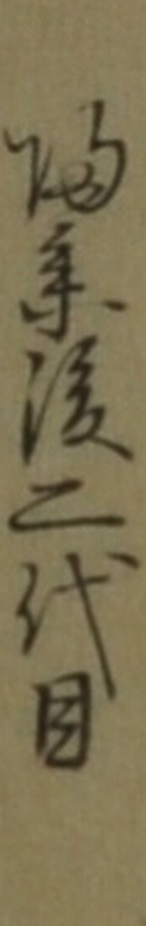帰参後二代目
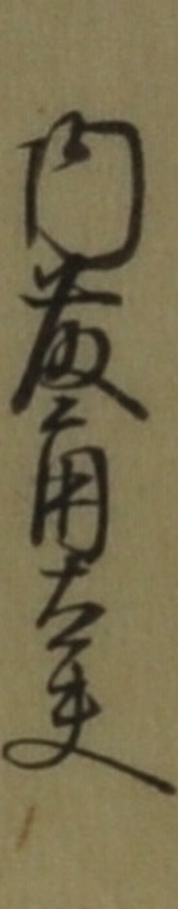内藤角太夫
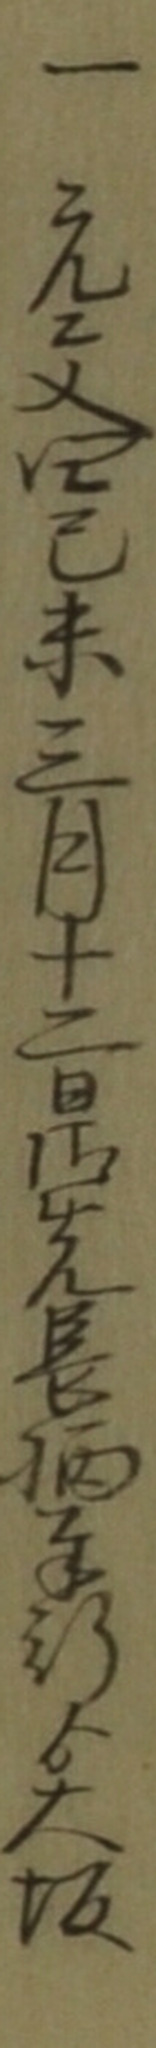一元文四己未三月十二日御先長柄奉行ゟ大坂
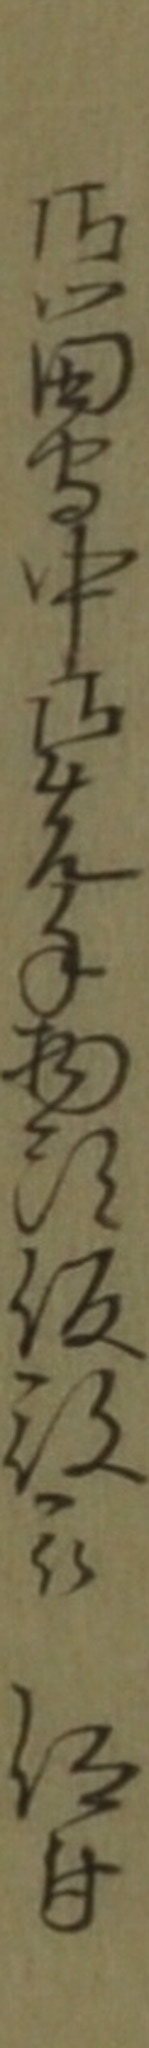御留守中御先手物頭仮役被仰付

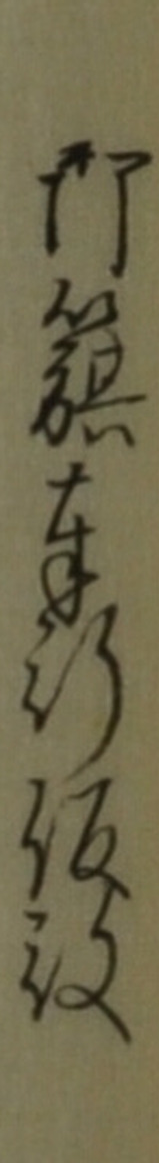御籏奉行仮役
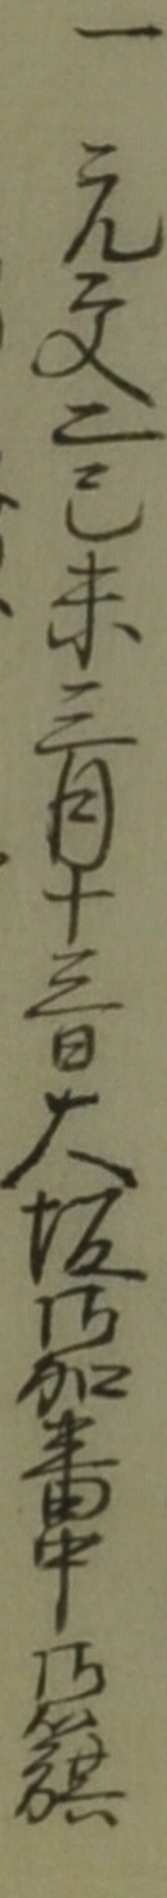一元文二乙未三月十三日大坂御加番中御籏
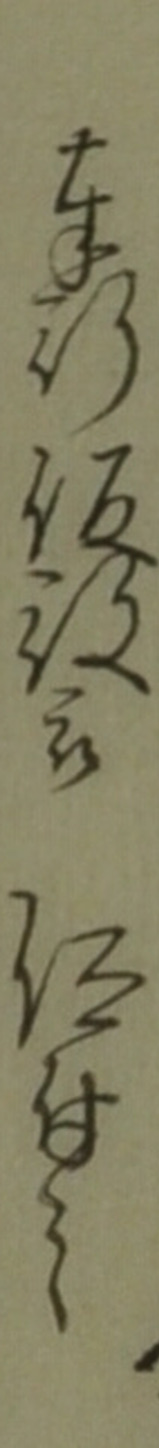奉行仮役被仰付之
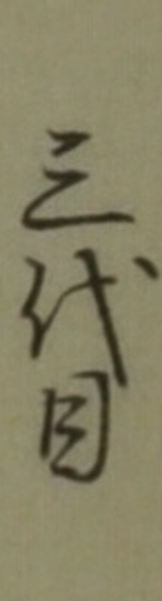三代目
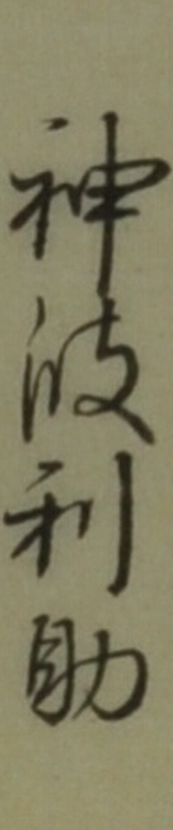神波利助
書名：諸御役代々録（二）
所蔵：伊那市立高遠町図書館・合同会社AMANE
